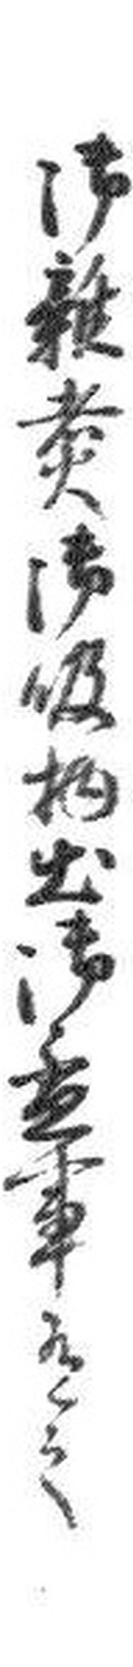御雑煮御吸物出御盃事有之
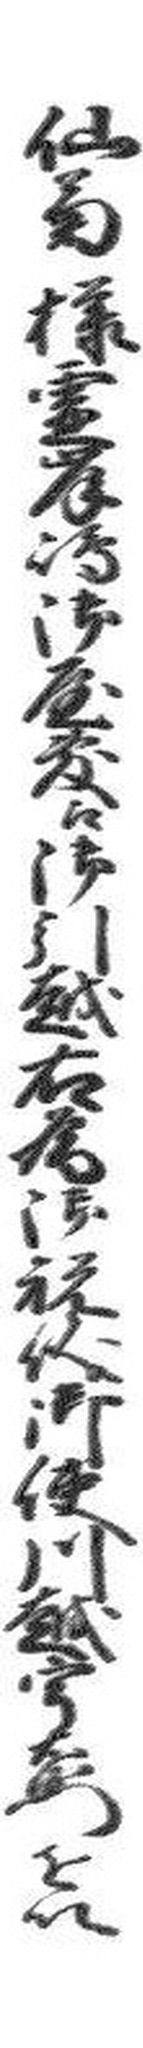仙菊様霊岸嶋御屋敷江御引越右為御祝儀御使川越宇右衛門を以
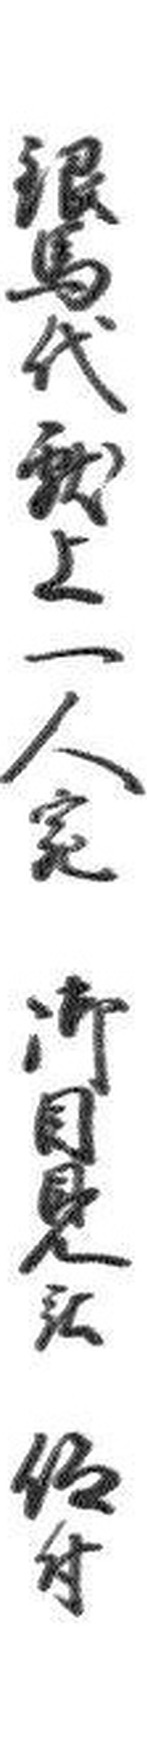銀馬代献上一人宛御目見被仰付

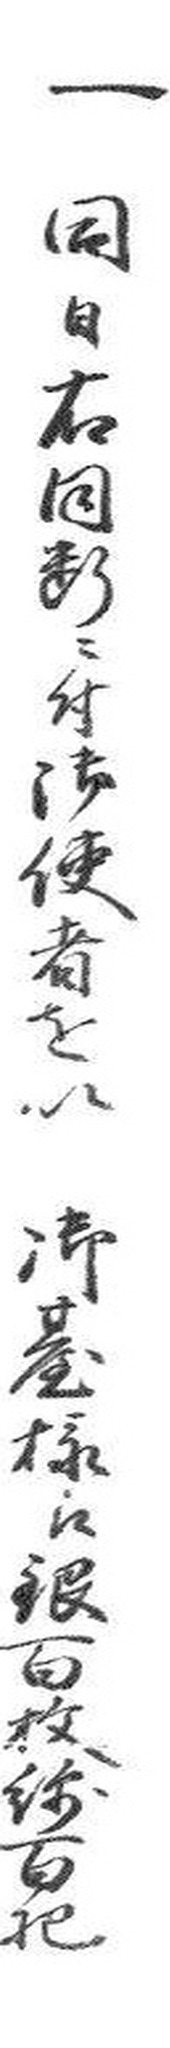一同日右同断二付御使者を以御台様江銀百枚綿百把
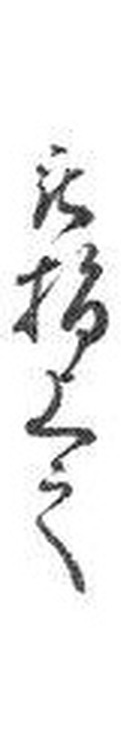被指上之
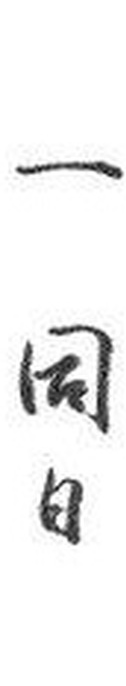一同日
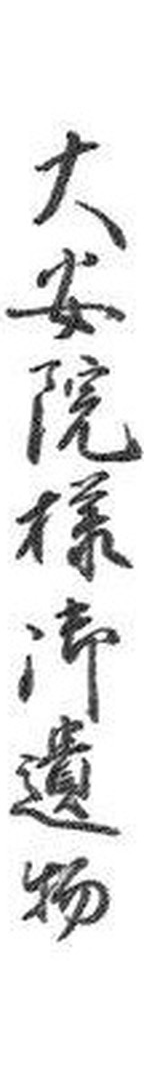大安院様御遺物
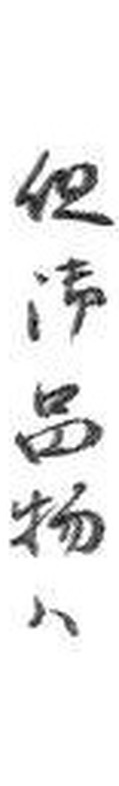但御品物ハ
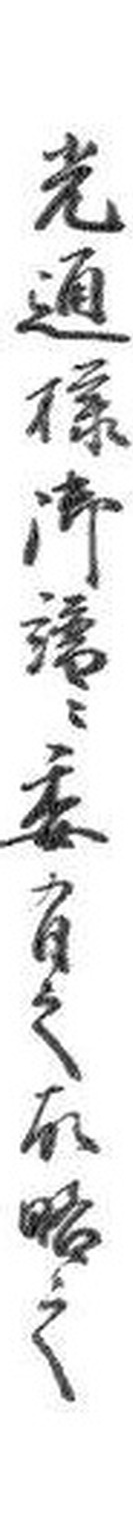光通様御譜ニ委有之故略之
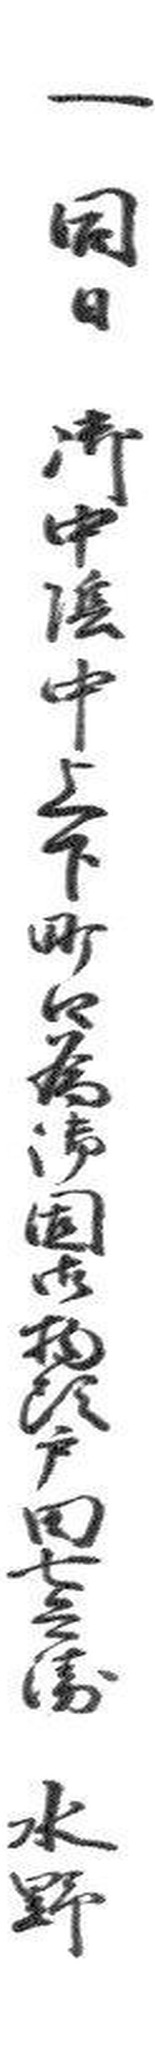一同日御中陰中上下町口為御固御物頭戸田七兵衛水野
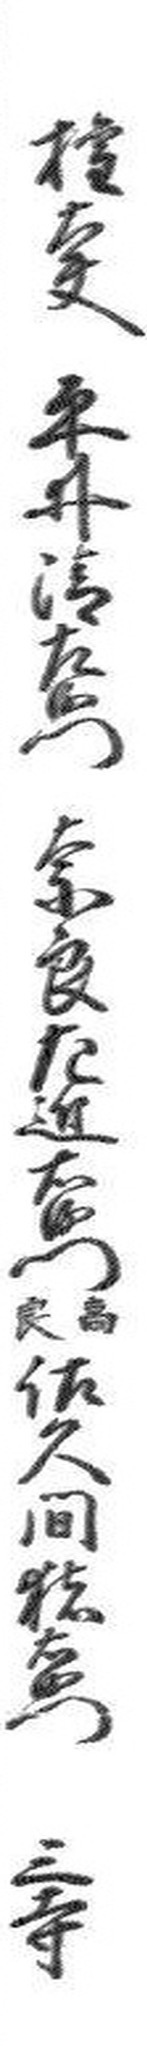権太夫平井清左衛門奈良左近右衛門高良佐久間猪右衛門三寺
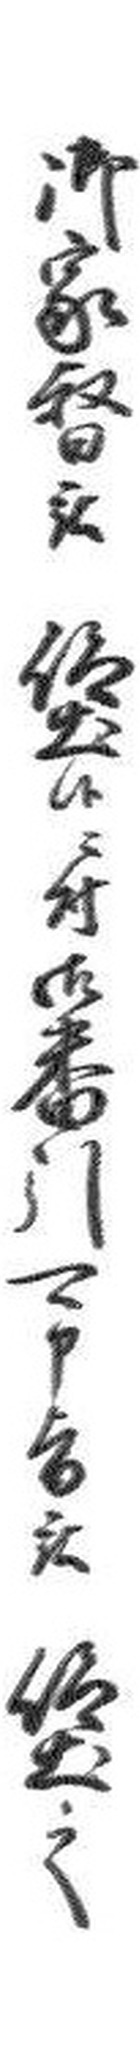御家督被仰出候ニ付御番引可申旨被仰出之
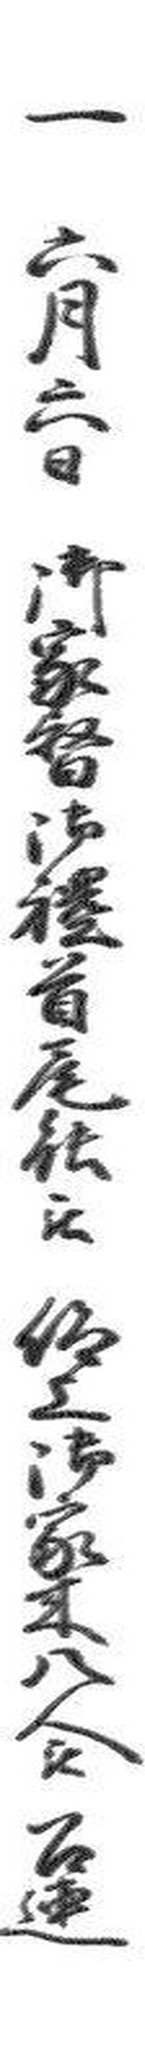一六月六日御家督御礼首尾能被仰上御家来八人被召連
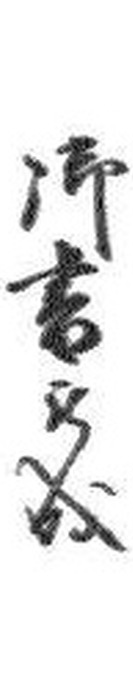御書被成
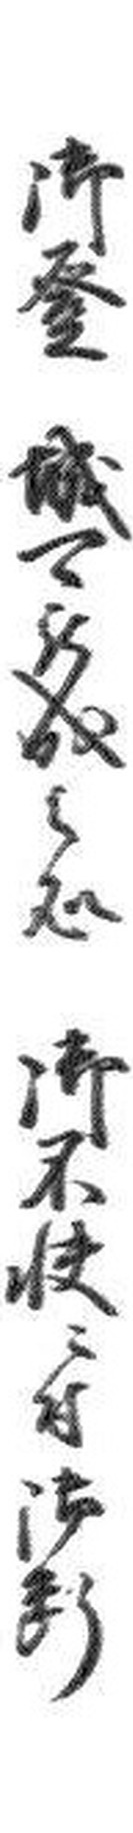御登城可被成之処御不快ニ付御断
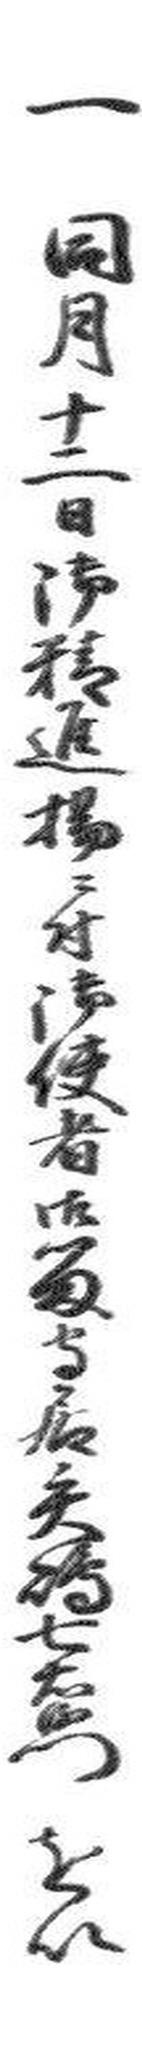一同月十二日御精進揚ニ付御使者御留守居矢嶋七右衛門を以
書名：家譜 十一 昌親公 従延宝二年到延宝四年八月
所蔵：福井県文書館 Fukui Prefectural Archives
